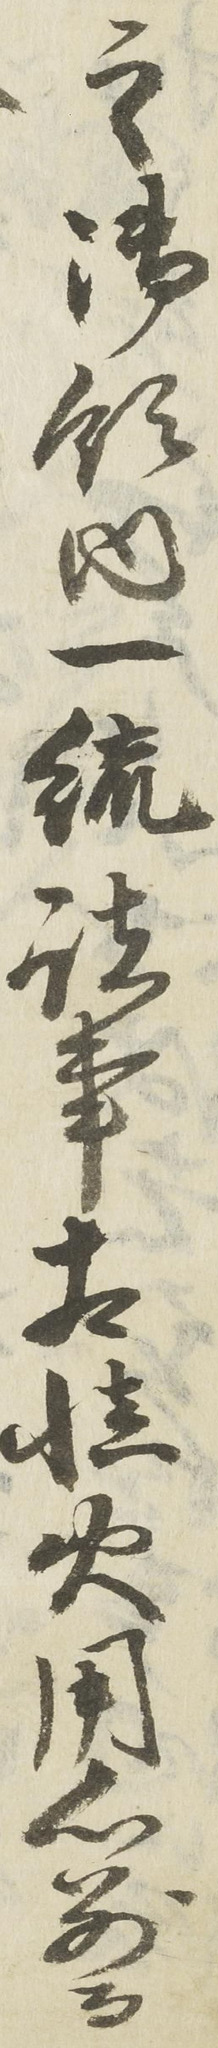之御領内一統諸事相慎火用心別而
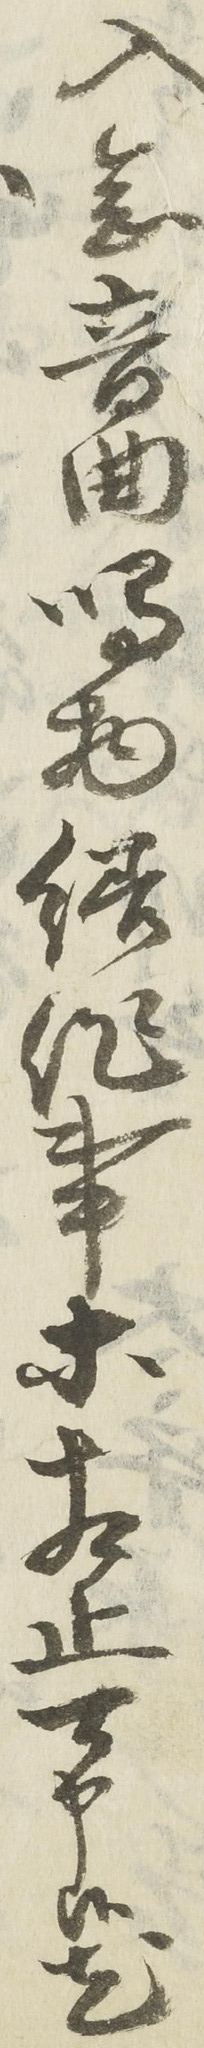入念音曲鳴物繕作事等相止可申候尤
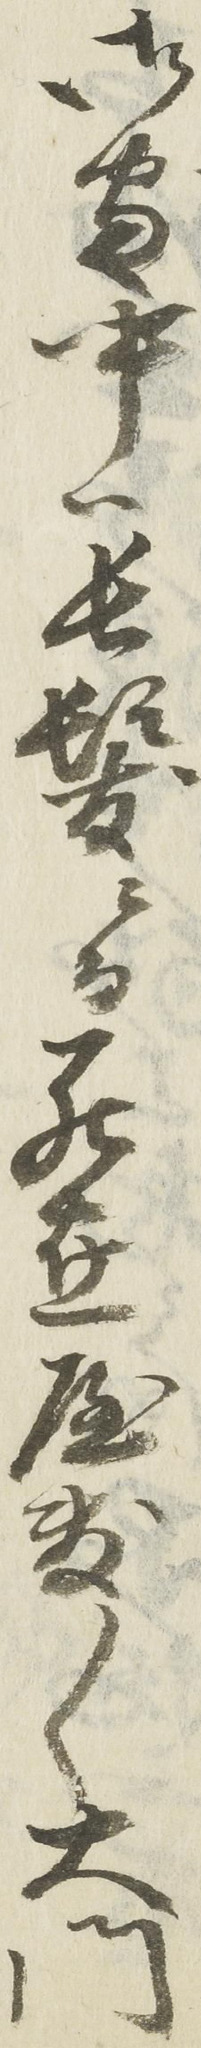御家中は長髪ニ而罷在屋敷〳〵大門
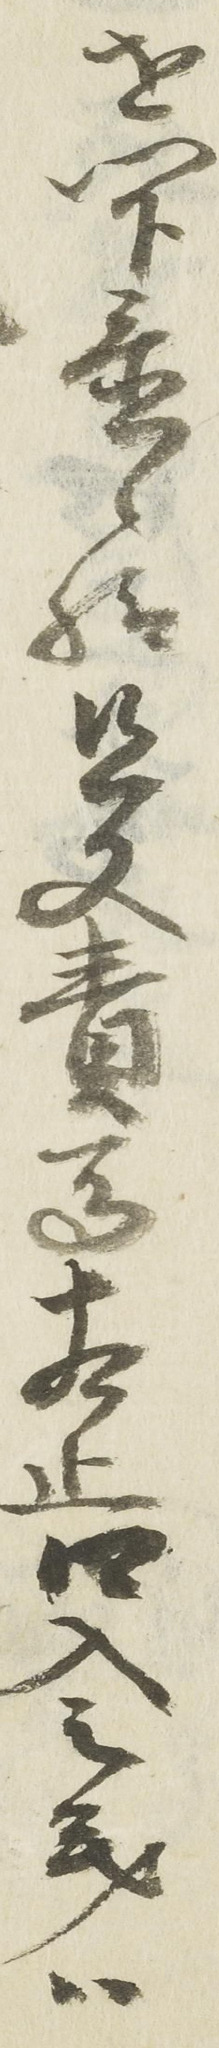を閉置候様且又責馬相止郷入の義は
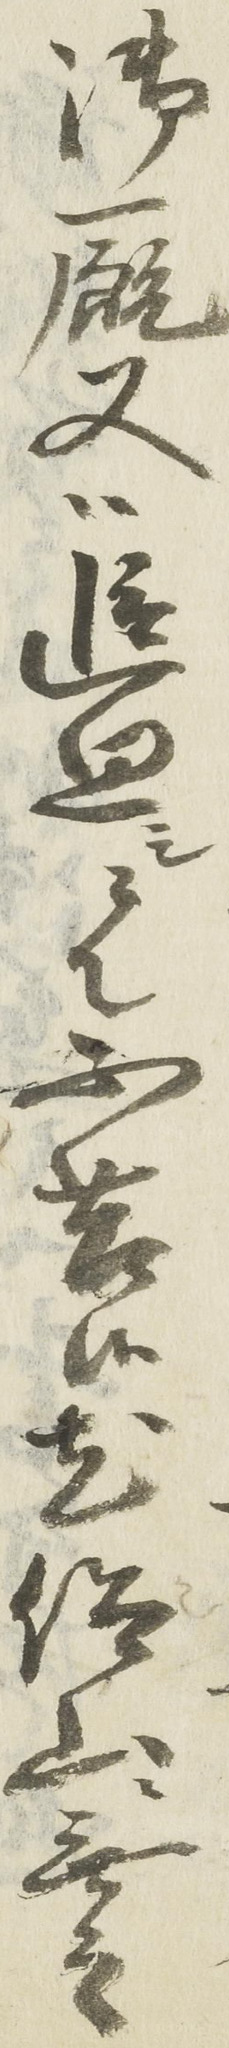御厩又は追廻シニて不苦候尤仰山ニ無之
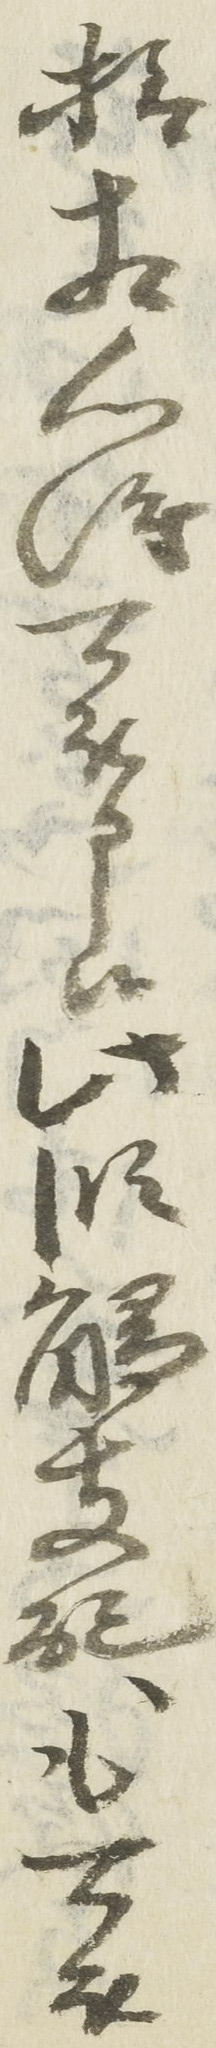様相心得可被申候此段触支配へも可被
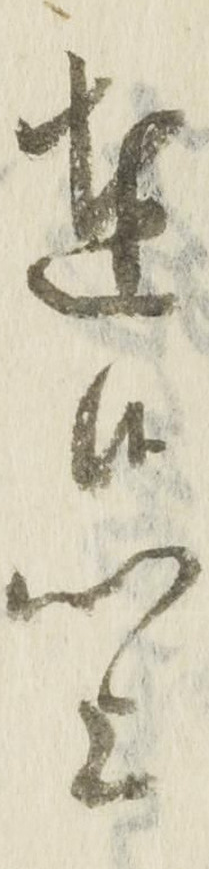達候以上
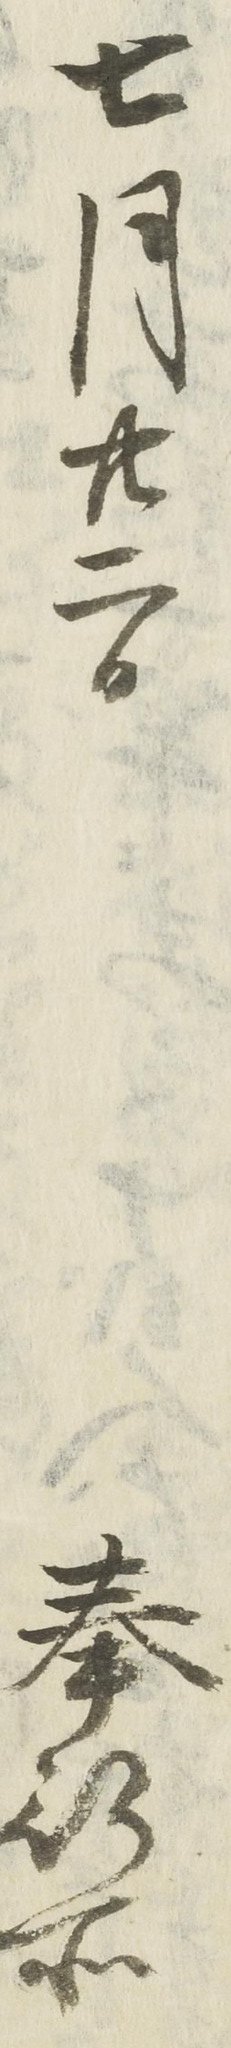七月廿二日奉行所
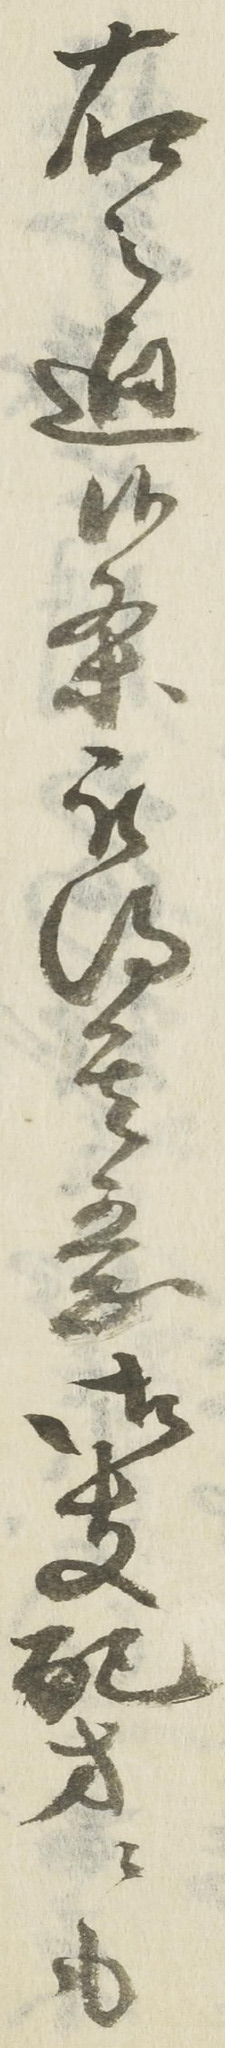右之通候条被得其意御支配方ニも
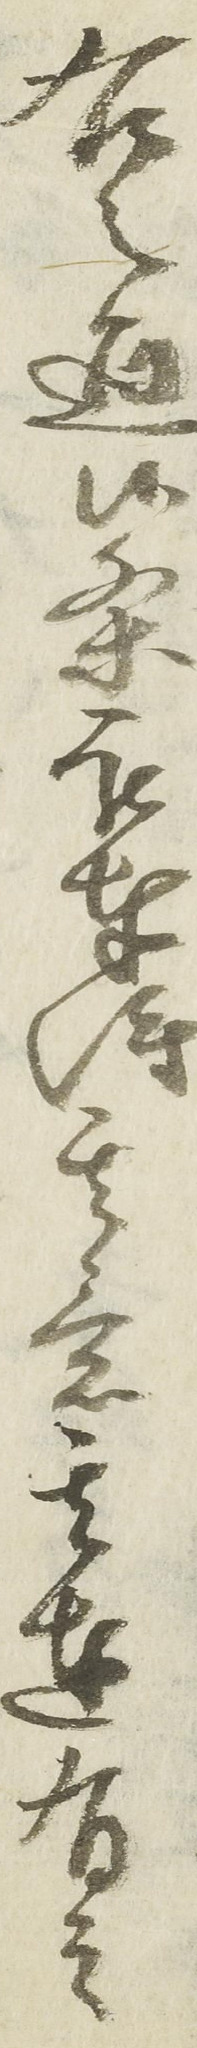右之通候条被奉得其意其達有之
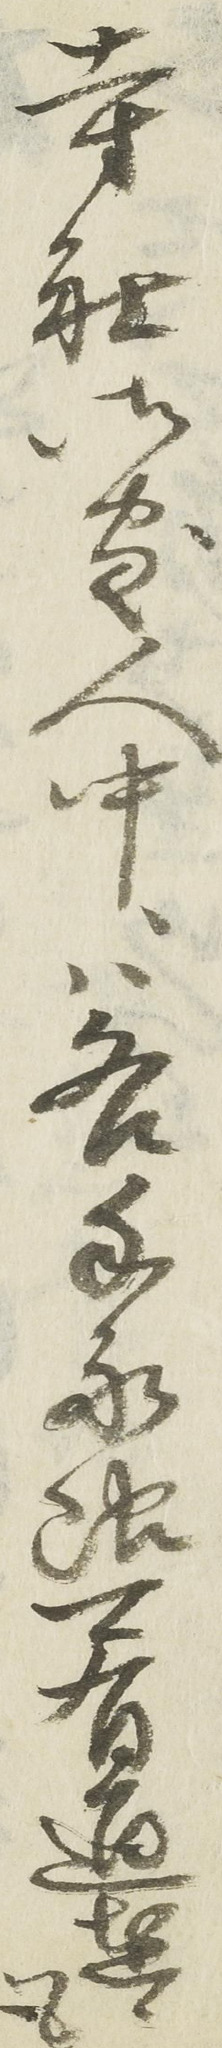寺社御家人中へは各手永限可有通達候以上
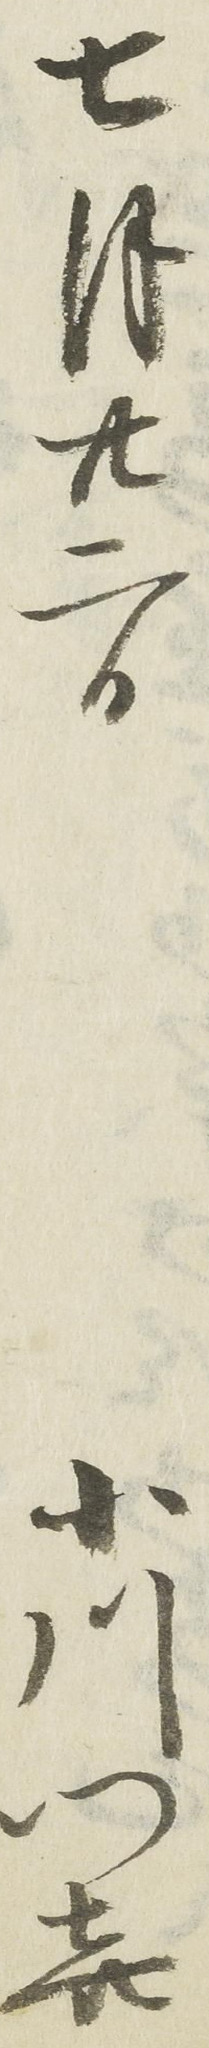七月廿二日小川門喜
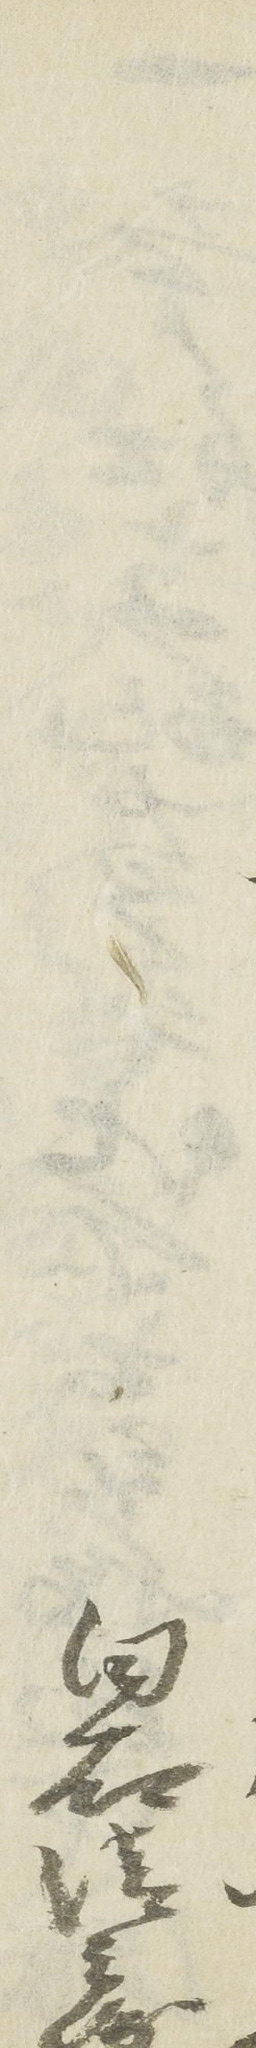白石清兵衛
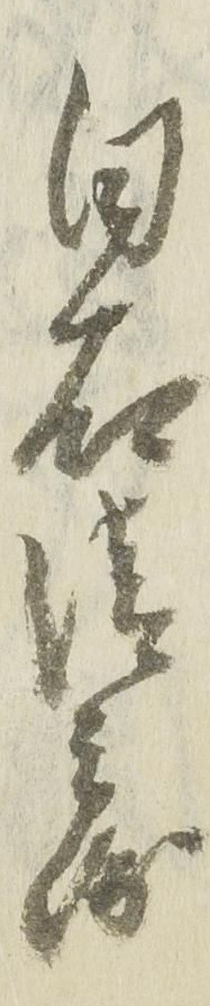白石清兵衛
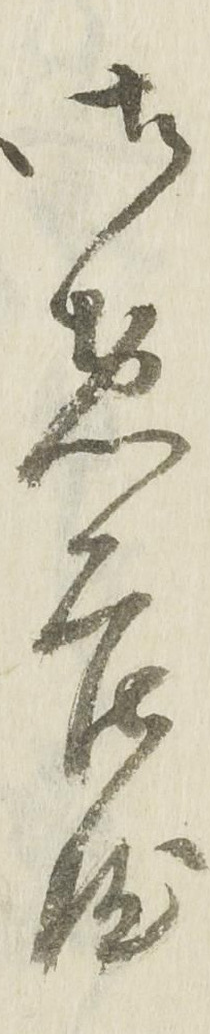御惣庄屋
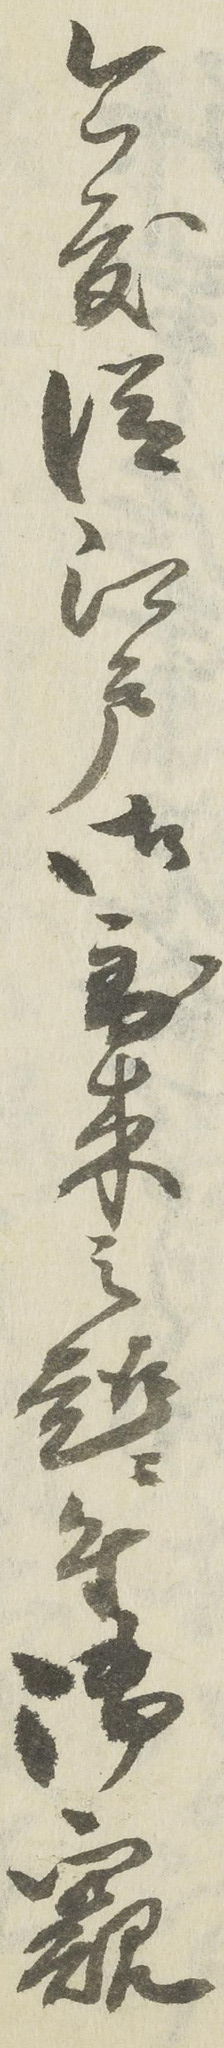今度従江戸御到来之趣ニ付御窺
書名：後見笑
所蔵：東京大学地震研究所図書室 Earthquake Research Institute Library, The University of Tokyo, JAPAN
